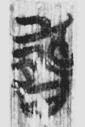寿
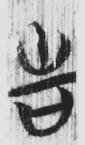告
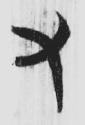又（有）
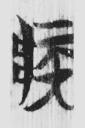疾
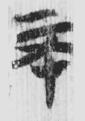不
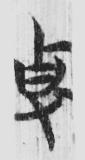史（事）
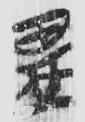○（明）
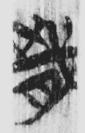歲
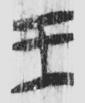王
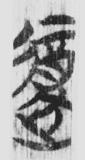○（復）
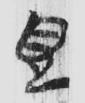见
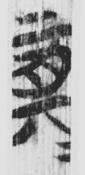奠（郑）
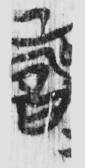寿
